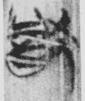猶
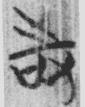時
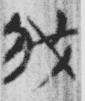我
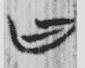曰
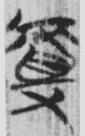○（且）
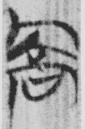{九高}（喬）
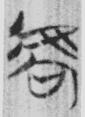○（乎）
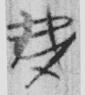弗
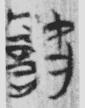○（飲）
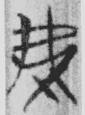復
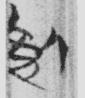飤（食）
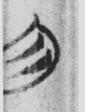勿（物）
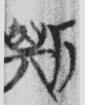斯
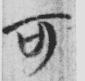可
